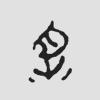胃
